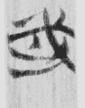武
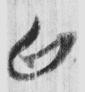㠯（以）
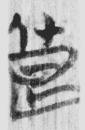良
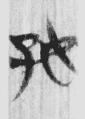好
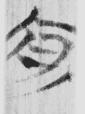宜
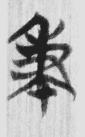秉
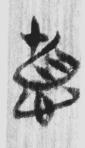惪
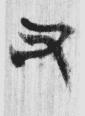又
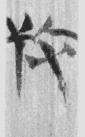攼
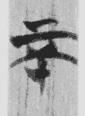不
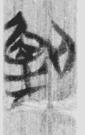解
